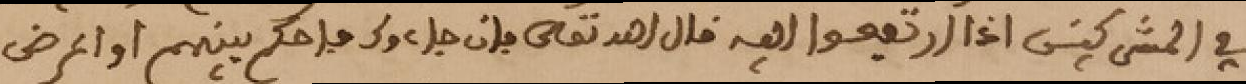في المشركين اذا ارتفعوا لله قال الله تعالى فان جاءوك فاحكم بينهم او اعرض
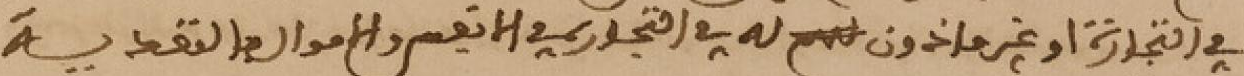في التجارة او غير ماذون له في اتجاره في الانفس والاموال فالتعدية
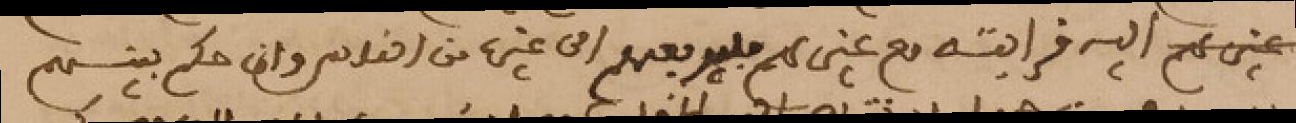غيرهم اليه قرابته مع غيرهم فليرفعهم الى غيره من الناس وان حكم بينهم
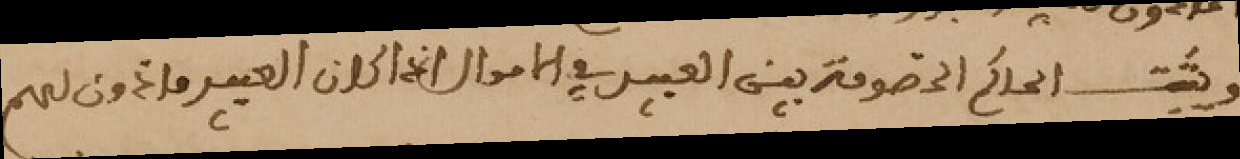ويثبت الحاكم الخصومة بين العبيد في الاموال اذا كان العبيد ماذون لهم
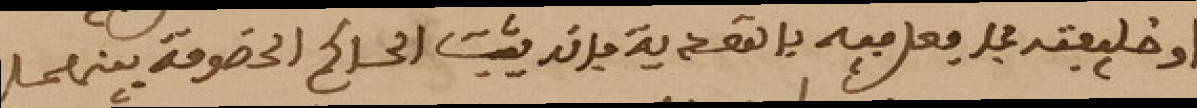او خليفته فما فعل فيه بالتعدية فانه يثبت الحاكم الخصومة بينهما
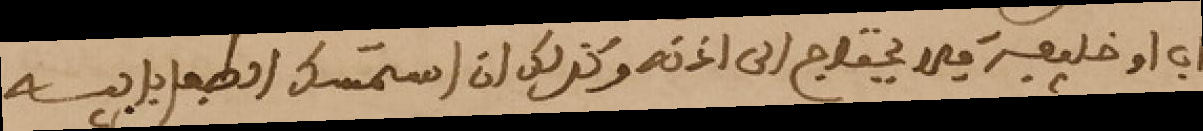اب او خليفة فلا يحتاج الى اذنه وكذلك ان استمسك الطفل بابيه
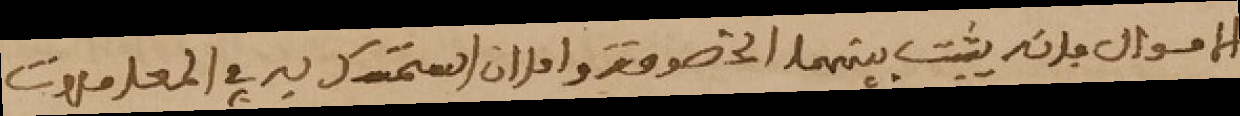الاموال فانه يثبت بينهما الخصومة واما ان استمسك به في المعاملات
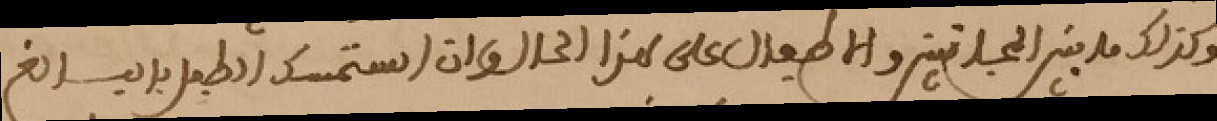وكذلك ما بين المجانين والاطفال على هذا الحال وان استمسك الطفل بالبالغ
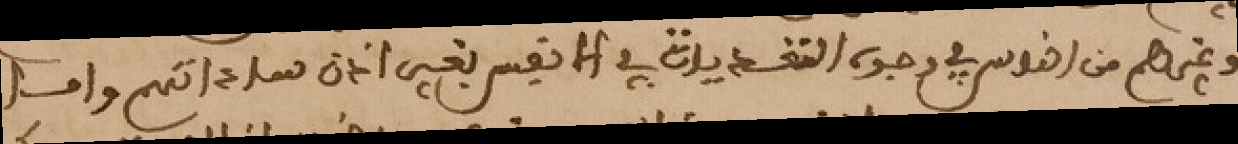وغيرهم من الناس في وجوه التعديات في الانفس بغير اذن ساداتهم واما
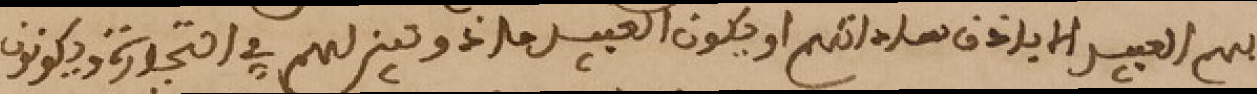بينهم العبيد الا باذن ساداتهم او يكون العبيد فاذ وتبين لهم في التجارة ويكونون
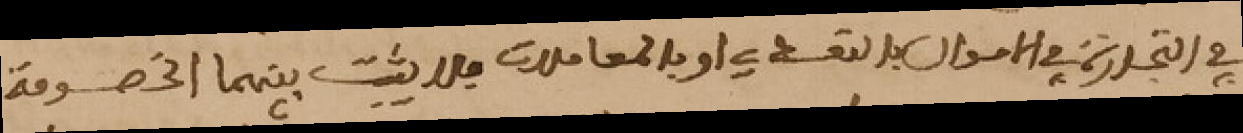في التجارة في الاموال بالتعدي او بالمعاملات فلا يثبت بينهما الخصومة
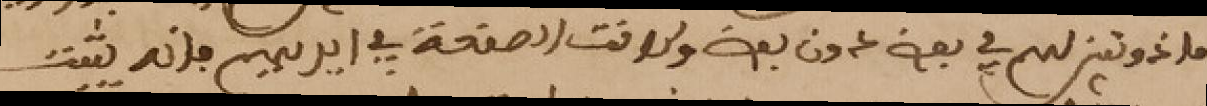ماذونين لهم في بعض دون بعض وكانت الصقعة في ايديهم فانه يثبت
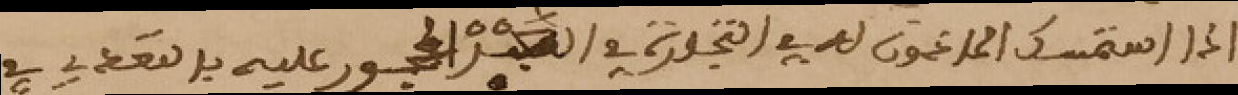اذا استمسك الماذون له في التجارة في العبد المحجور عليه بالتعدي في
